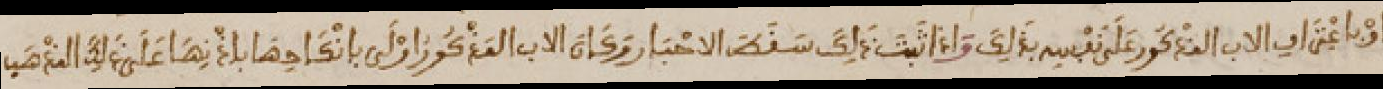او باعتراف الاب المذكور على نفسه بذلك و اذا ثبت ذلك سقط الاحبار وكان الاب المذكور اولى بانكاحها باذنها على ذلك المذهب
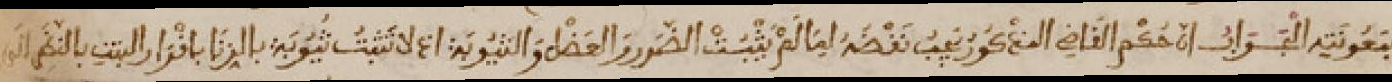بمعونته الجواب أن حكم القاضي المذكور يجب نقضه لما لم يثبت الضرر والعضل والثيوبة اذ لا تثبت ثيوبة بالزنا بإقرار البنت بالنظر الى
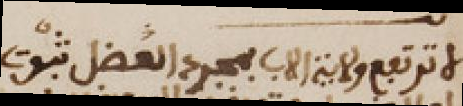لا ترفع ولاية الاب بمجرد العضل ثبوت
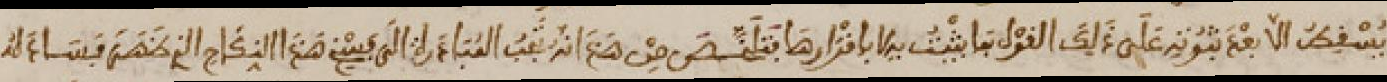يسقط الا بعد ثبوته على ذلك القول بما يثبث به لا باقرارها فتلخص من هذا انه تجب المبادرة الى فسخ هذا النكاح الذي ظهر فساده
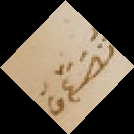تصدق
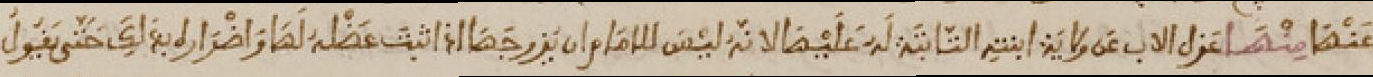عنها منها عزل الاب عن ولاية ابنته الثابتة له عليها لانه ليس للامام ان يزوجها اذا ثبت عضله لها واضراره بذلك حتى يقول
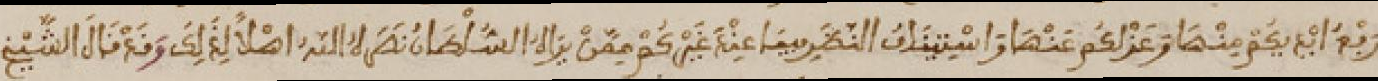رفع ايديكم منها وعزلكم عنها واستيناف النظر فيها عند غيركم ممن يراه السلطان نصره الله اهلا لذلك وقد قال الشيخ
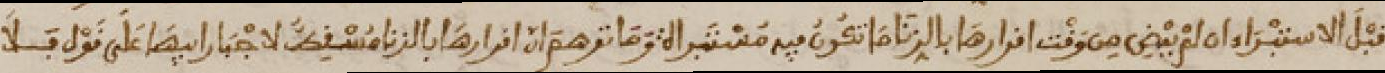قبل الاستبراء ان لم يمض من وقت اقرارها بالزنا ما تكون فيه مستبراة وما توهم ان اقرارها بالزنا مسقط لاجبار ابيها على قول فلا
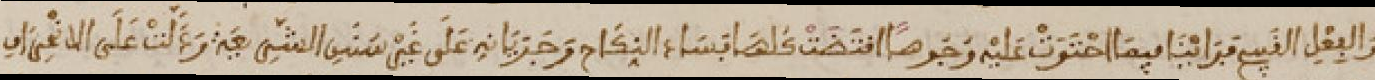و الفعل القبيح فراينا فيما احتوت عليه وجوها اقتضت كلها فساد النكاح وجريانه على غير سنن الشريعة ودلت على الانحراف
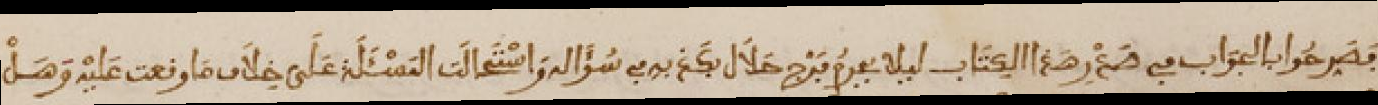فصرحوا بالجواب في صدر هذا الكتاب ليلا يحرم فرج حلال بكذبه في سؤاله واستحالت المسئلة على خلاف ما وقعت عليه وهل
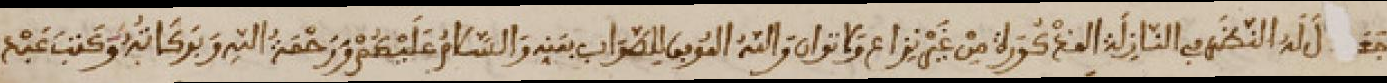جعل له النظر في النازلة المذكورة من غير نزاع ولا توان والله الموفق للصواب بمنه والسلام عليكم ورحمة الله وبركاته وكتب عبد
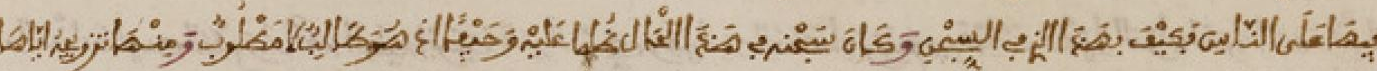فيها على الناس فكيف بهذا الذي في السجن وكان سجنه في هذا الحال ظلما عليه وَحَيْفاً اذ هو طالب لا مطلوب ومتها تزويجه إياها
